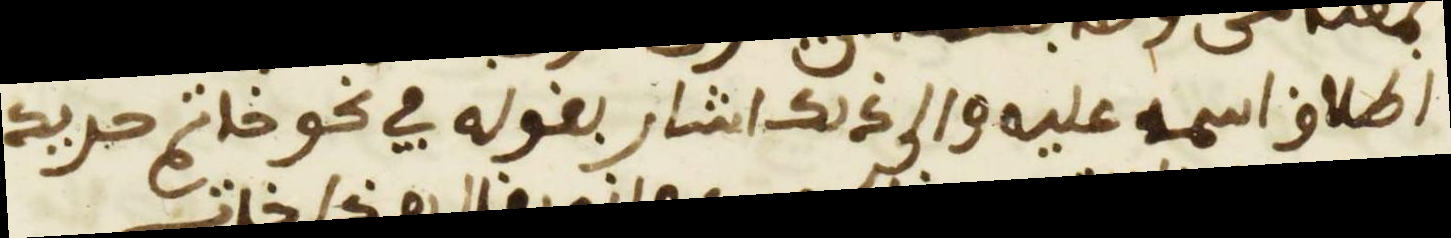اطلاق اسمه عليه والى ذلك اشار بقوله في نحو خاتم حريد
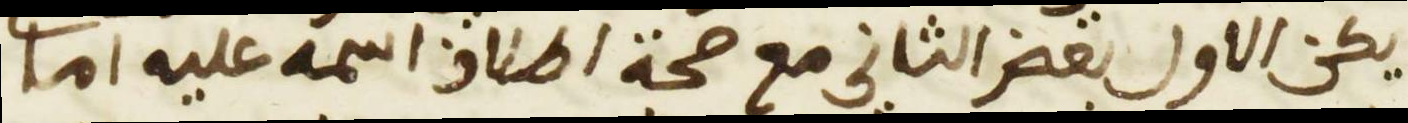يكن الاول بعض الثاني مع صحة اطلاق اسمه عليه اما
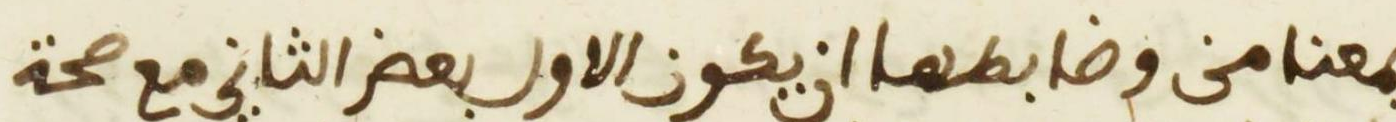بمعنا من وضابطهما ان يكون الاول بعض الثاني مع صحة
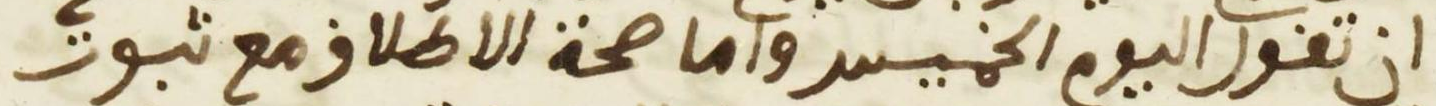ان تقول اليوم الخميس واما صحة الاطلاق مع ثبوت
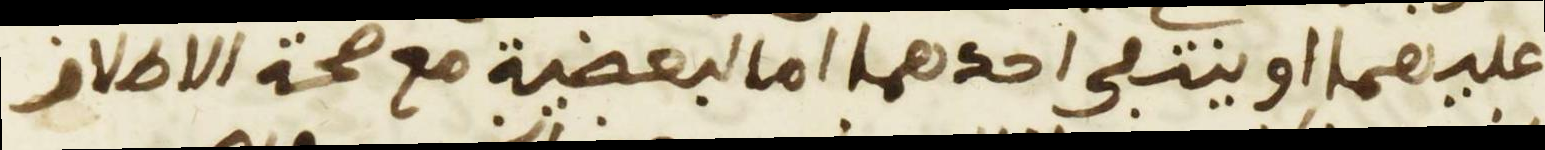عليهما او ينتفي احدهما اما البعضية مع صحة الاطلاق
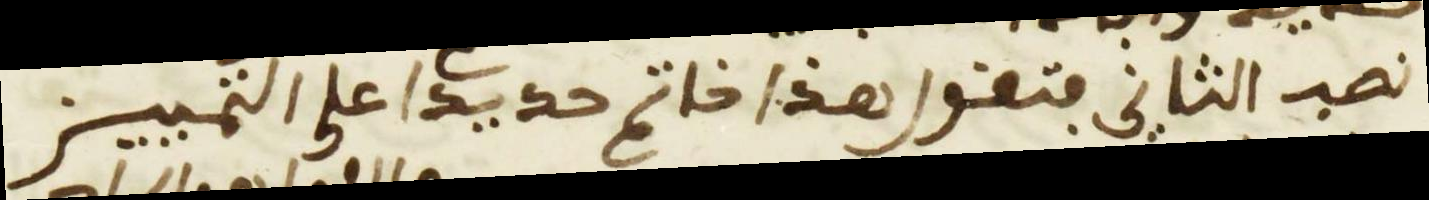نصب الثاني فتقول هذا خاتم حديدا على التمييز
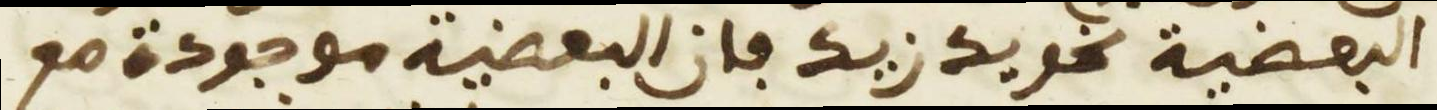البعضية نحو يج زيد فان البعضية موجودة مع
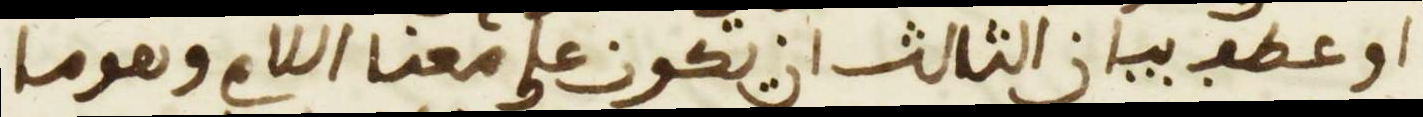او عطف بيان الثالث ان يكون على معنا اللام وهو ما
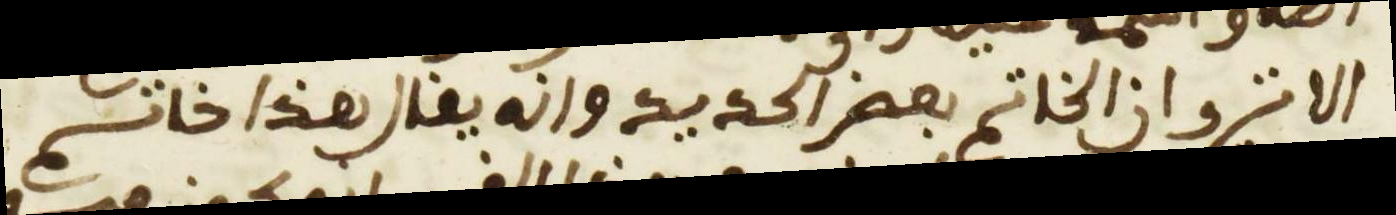الا تروان الخاتم بعض الحديد وانه يقال هذا خاتم
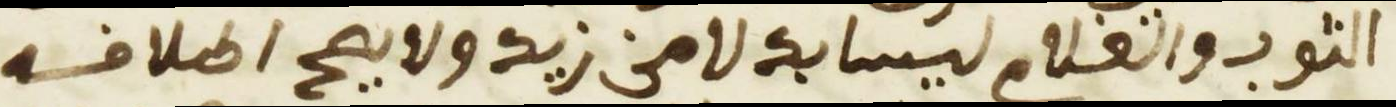الثوب والغلام ليسا بدلا من زيد ولا يصح اطلاقه
